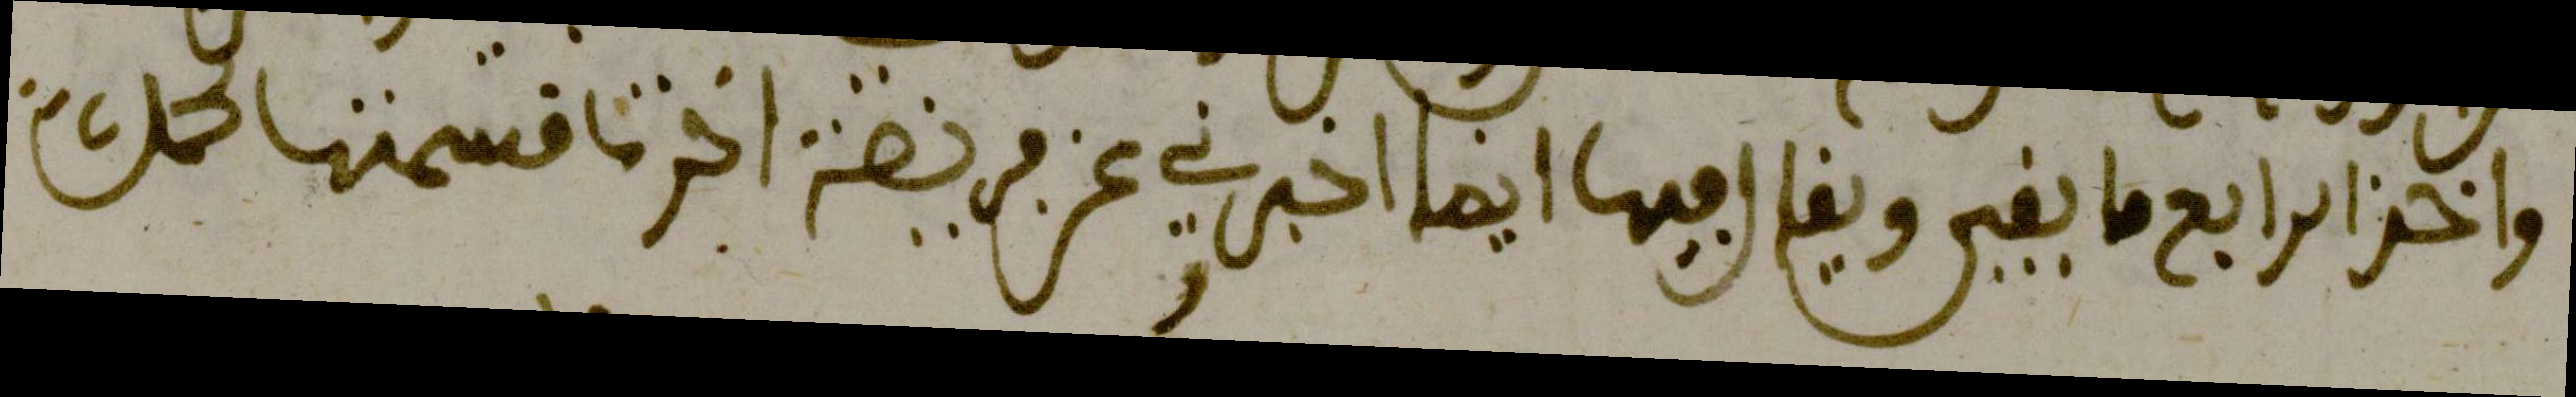واخذ الرابع ما بقي ويقال فيها ايضا اخبرني عن فريضة اخرت قسمتها لحمل
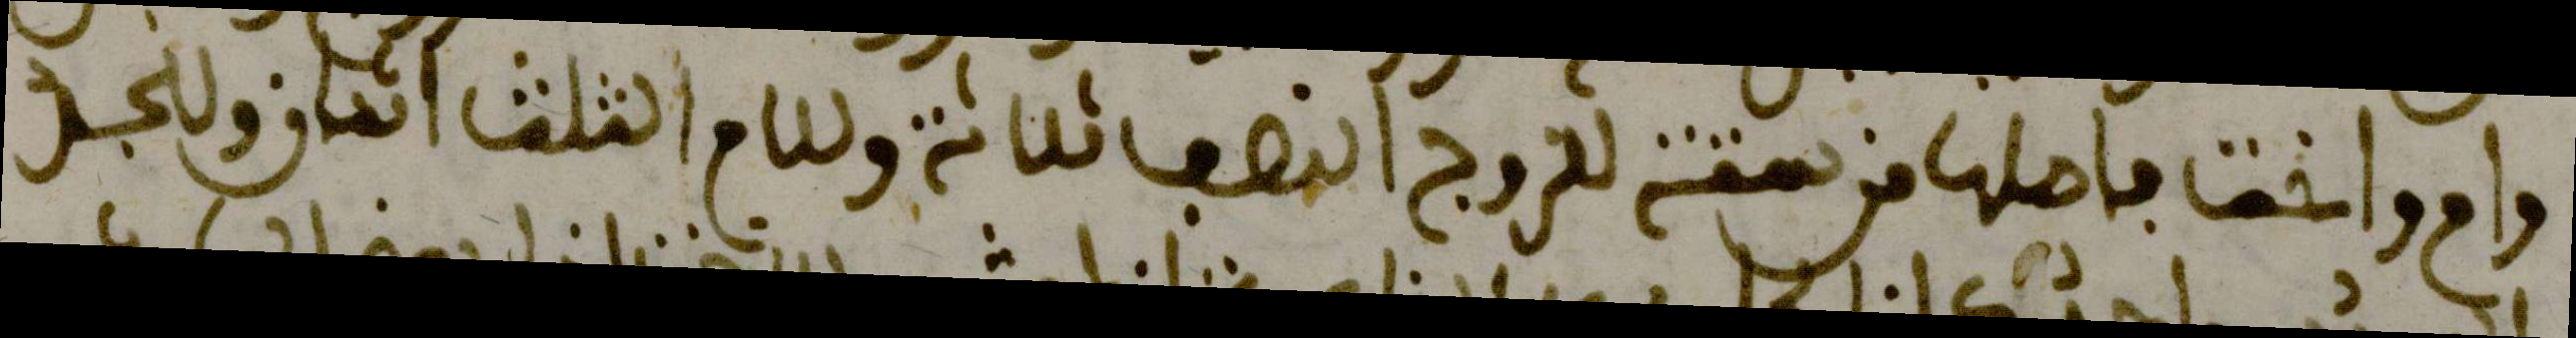وام واخت فاصلها من ستة للزوج النصف ثلاثة وللام الثلث اثنان وللجد
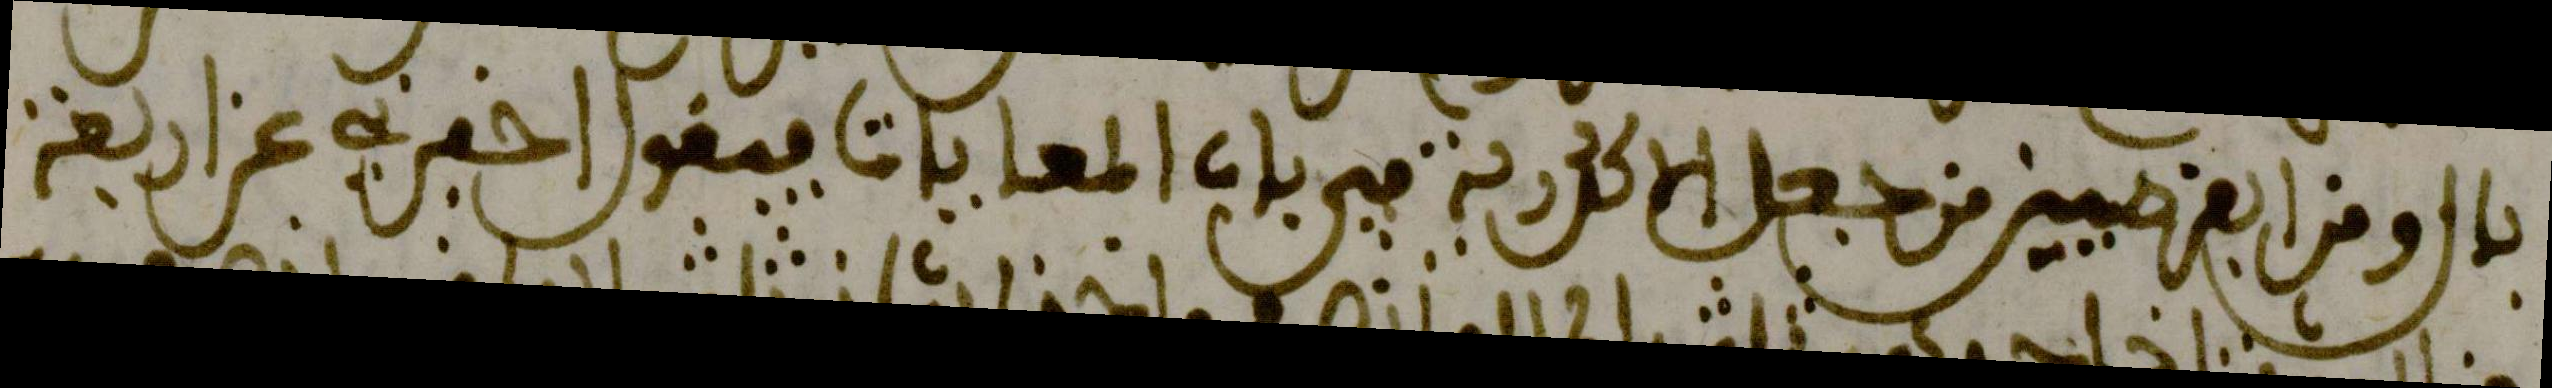بال ومن الفرضيين من جعل الا كدرية في باب المعايات فيقول اخبرني عن اربعة
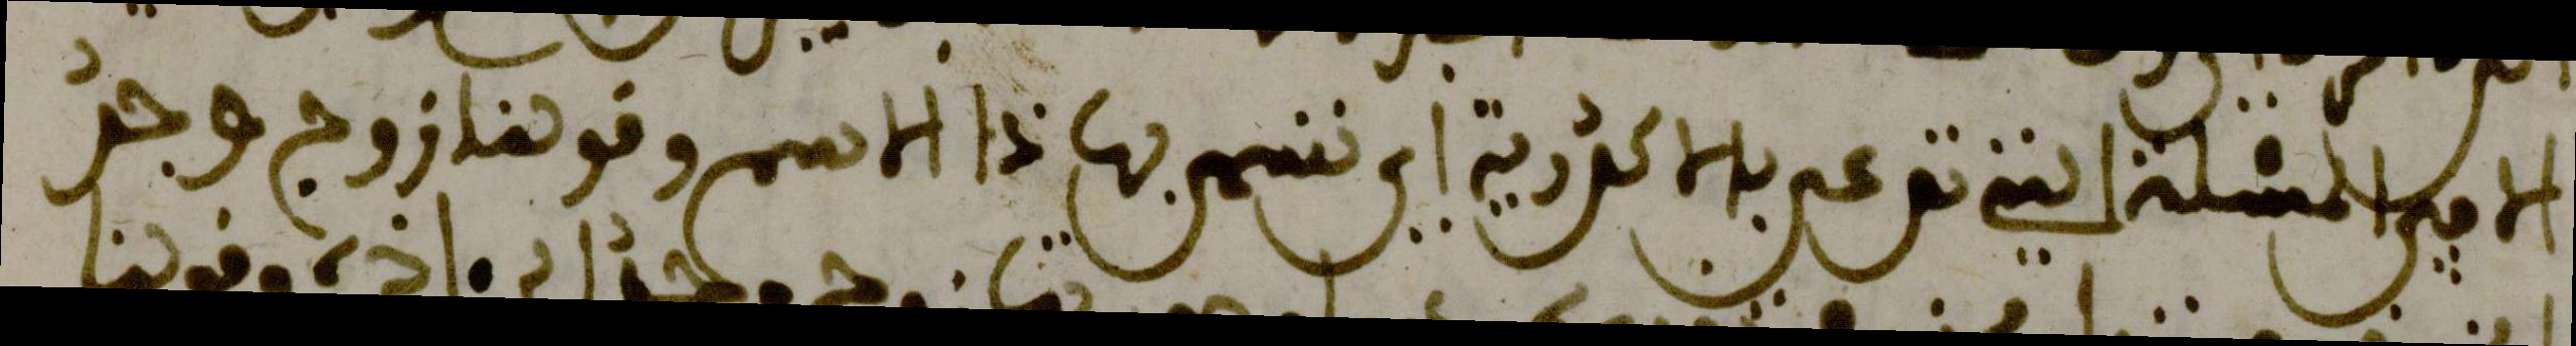الا في المسْلة التي تدعى بالاكدرية اي تسمى بهاذا الاسم وقولنا زوج وجد
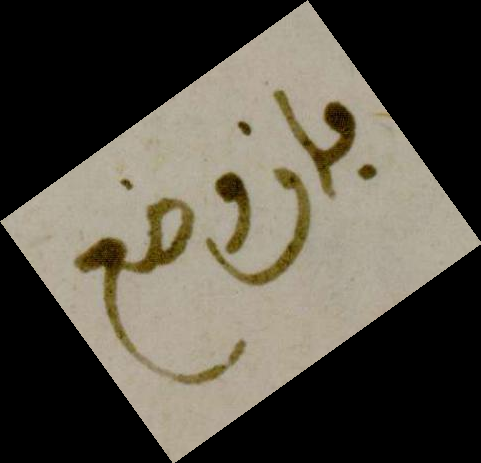فان وضع
